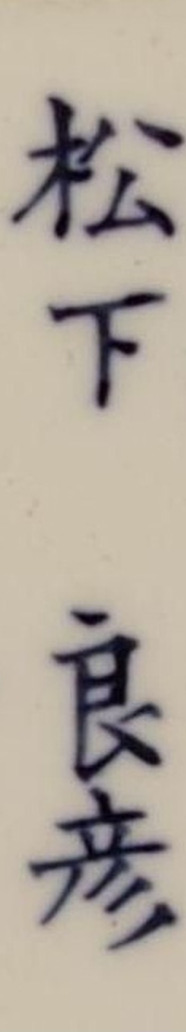松下良彦
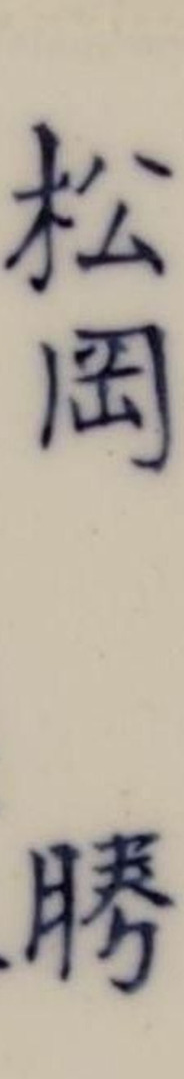松岡勝
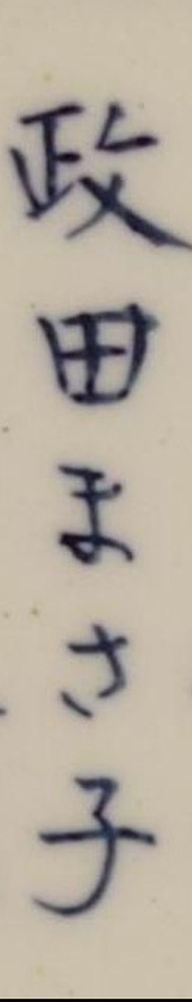政田まさ子
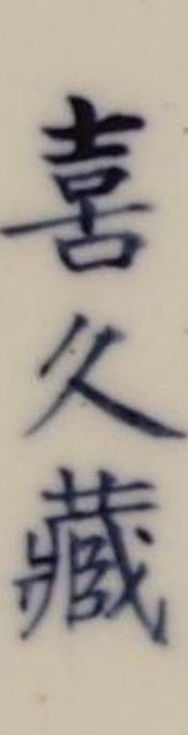喜久蔵
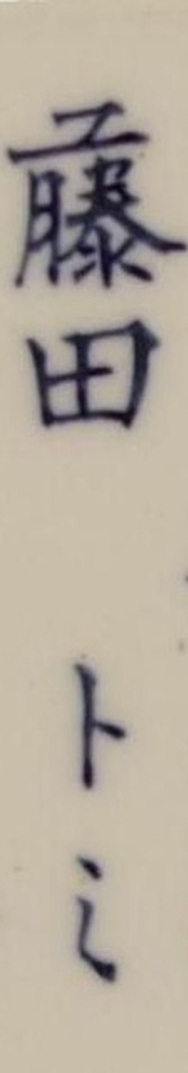藤田トミ
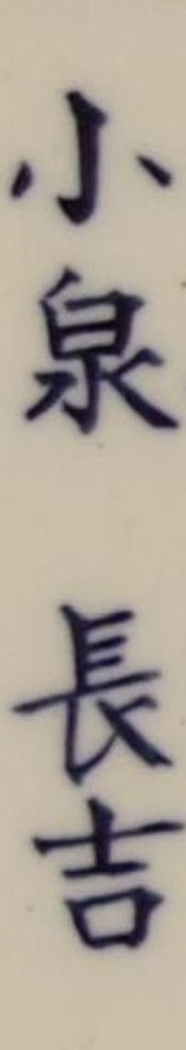小泉長吉
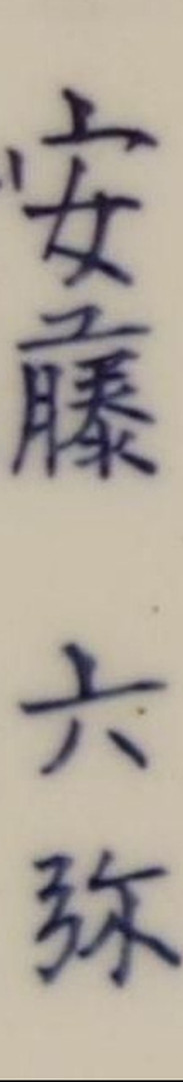安藤六弥
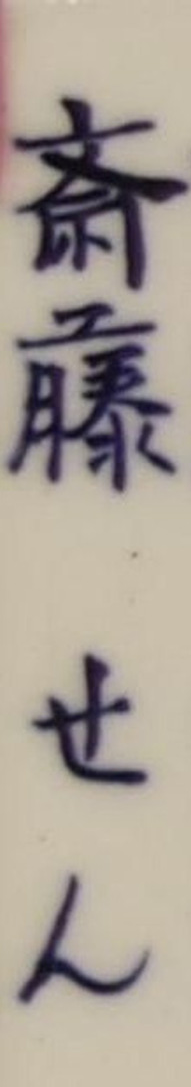斎藤せん

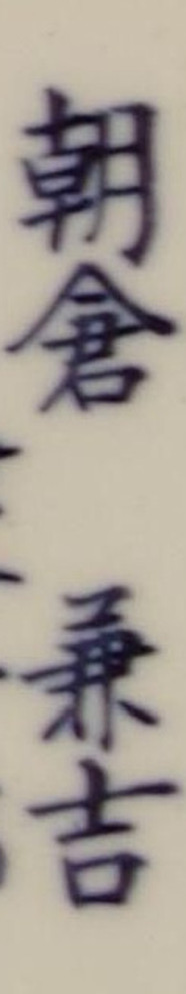朝倉兼吉
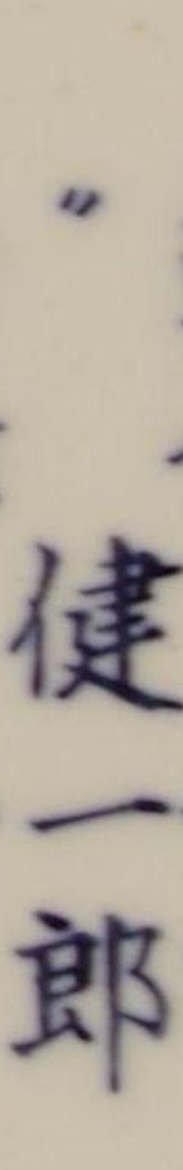健一郎
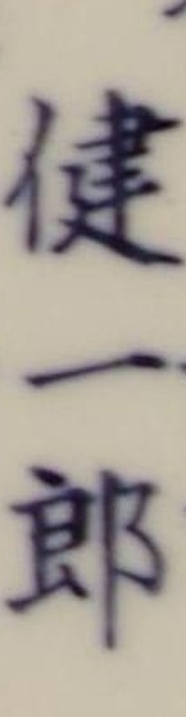健一郎
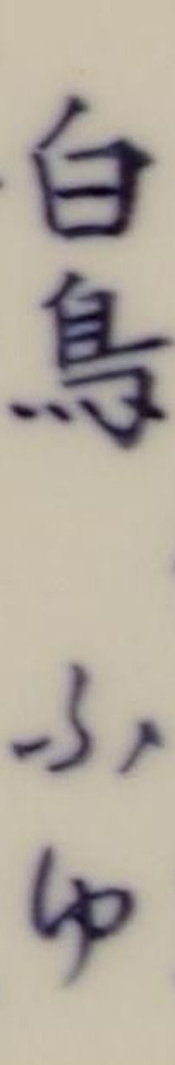白鳥ふゆ
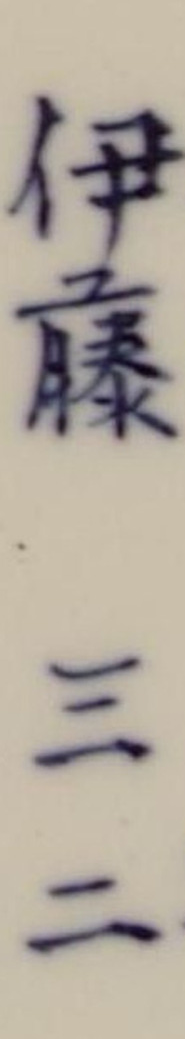伊藤三二
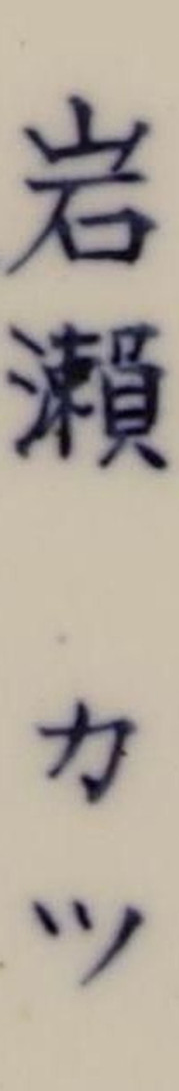岩瀬カツ
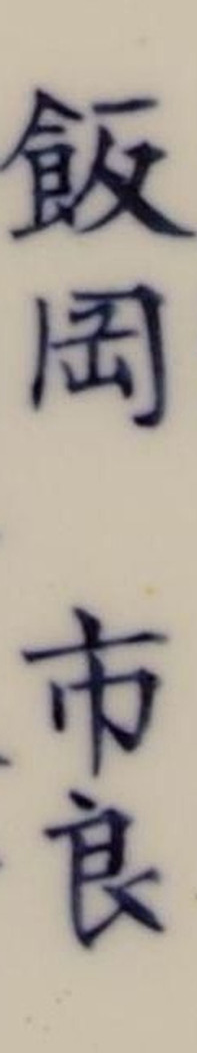飯岡市良
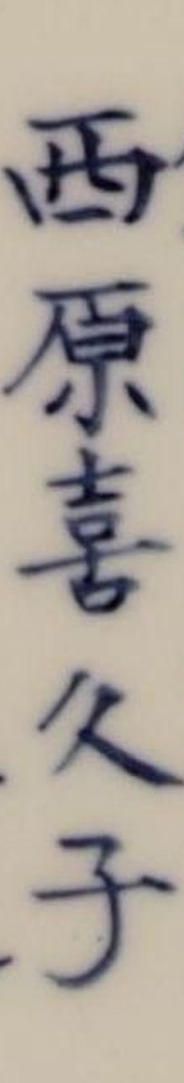西原喜久子
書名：E~L
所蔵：高野山金剛峯寺
